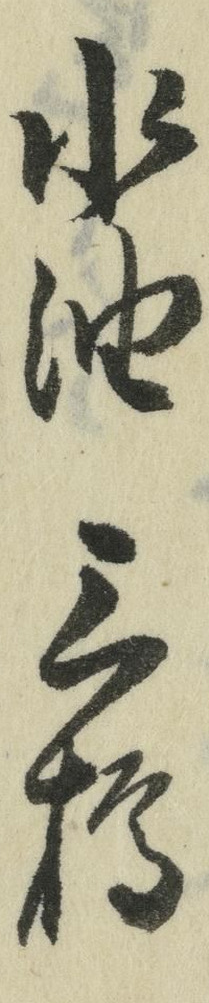水油三樽
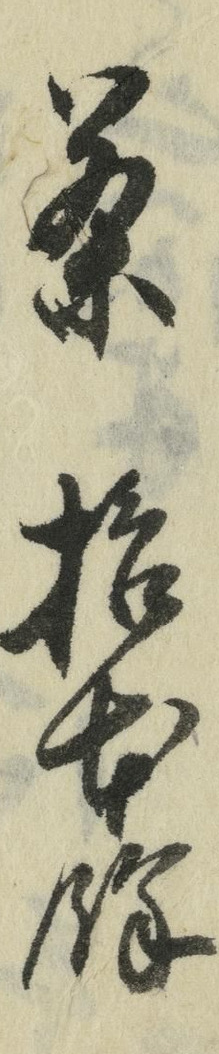茶拾本餘
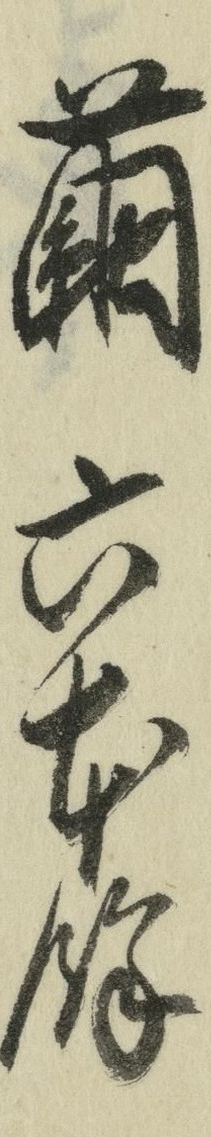繭六本餘
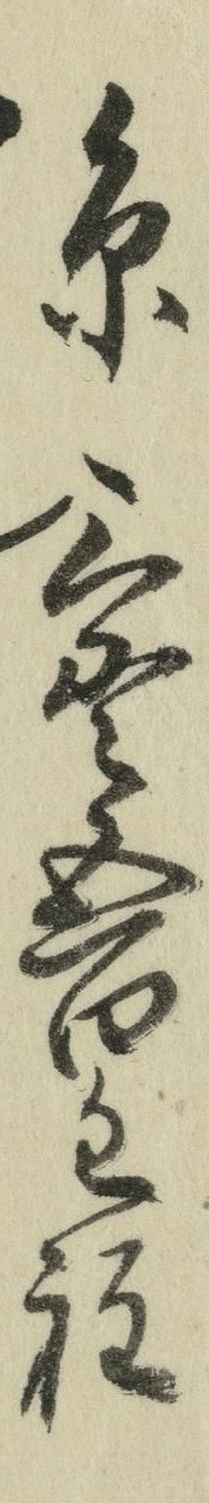糸三貫五百包程
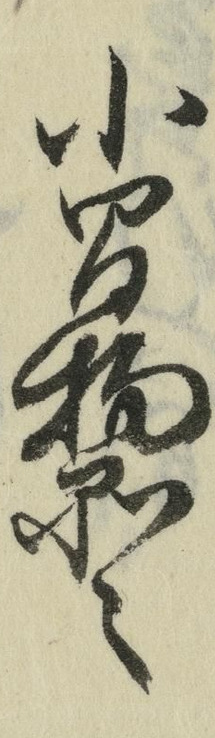小間物品々
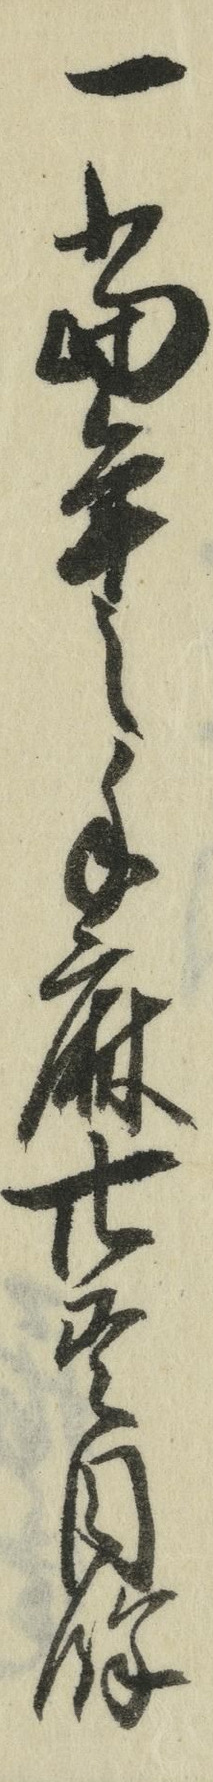一当年の手麻廿貫目程
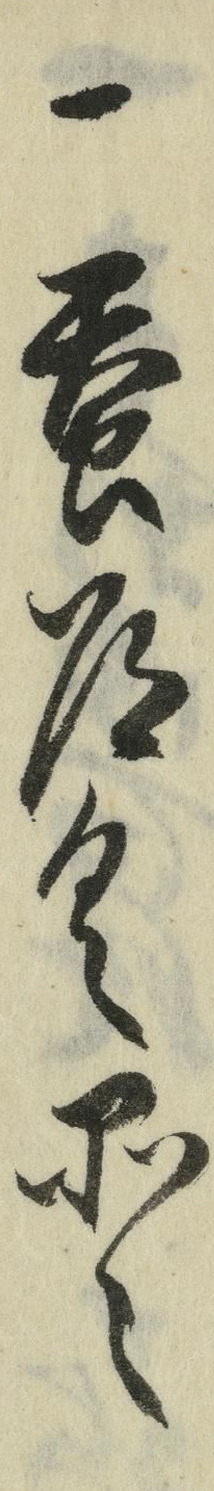一蚕道具品々
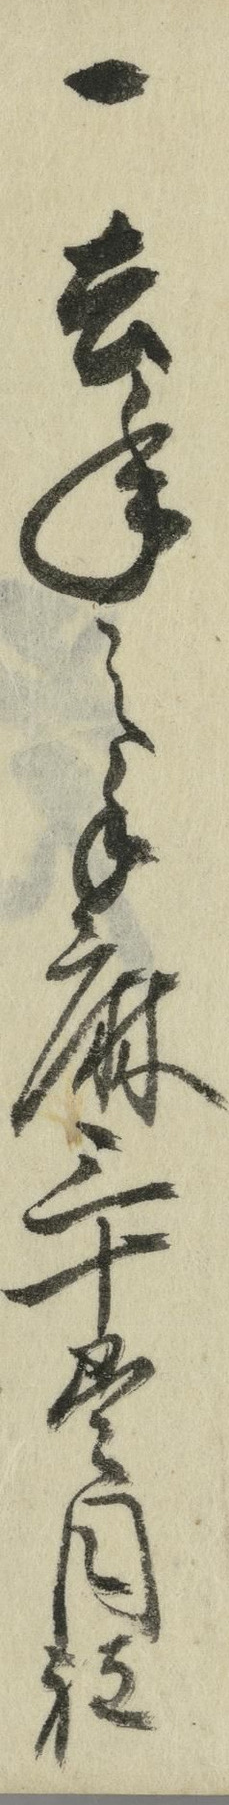一去年之手麻三十貫目程

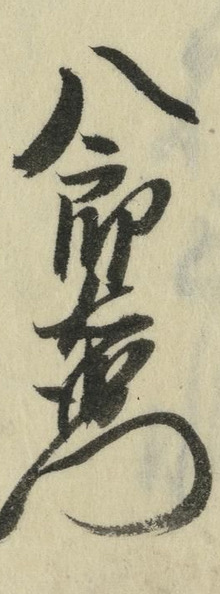八郎右衛門
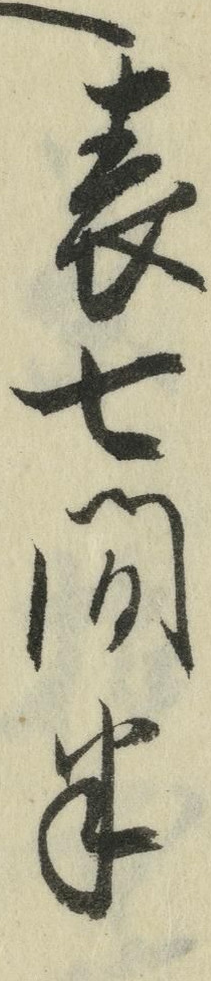表七間半
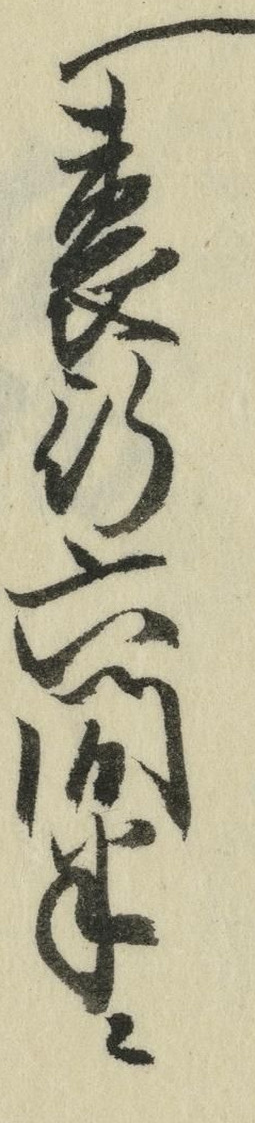裏行六間半二
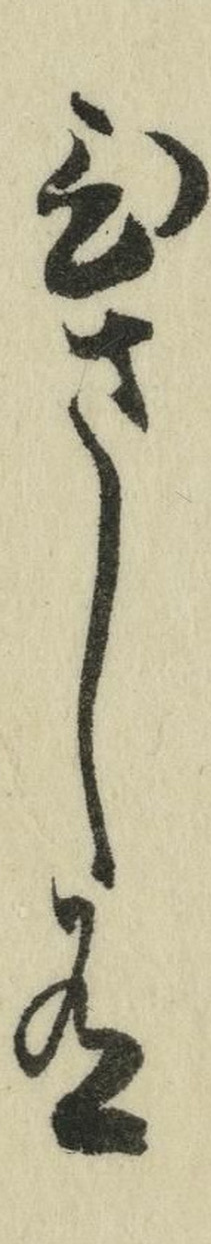ひさし有
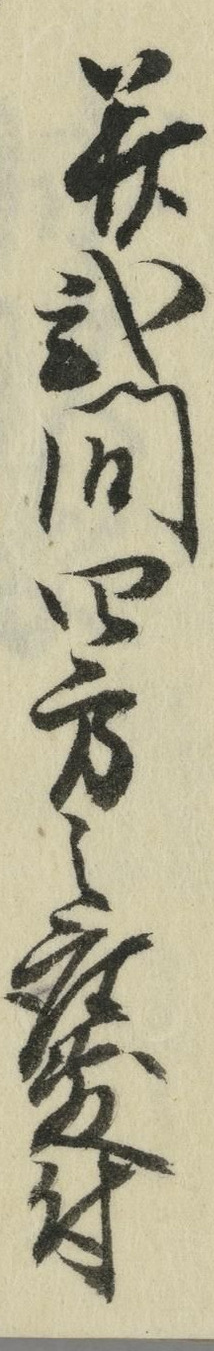并弐間四方之座敷付
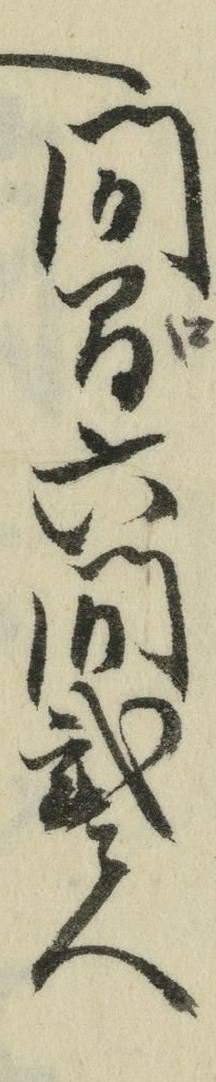間間六間弐尺
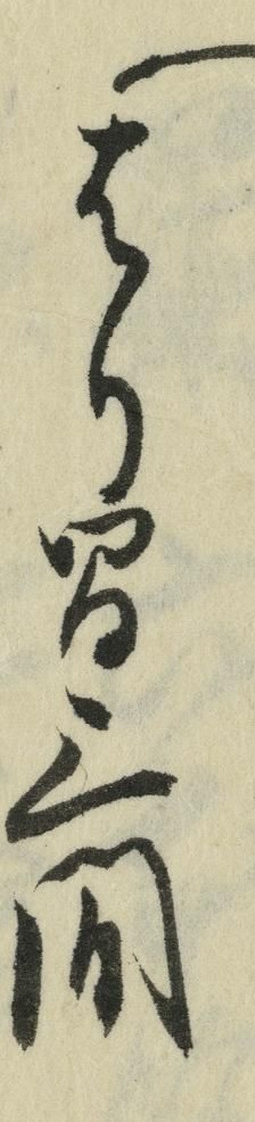はり間三間
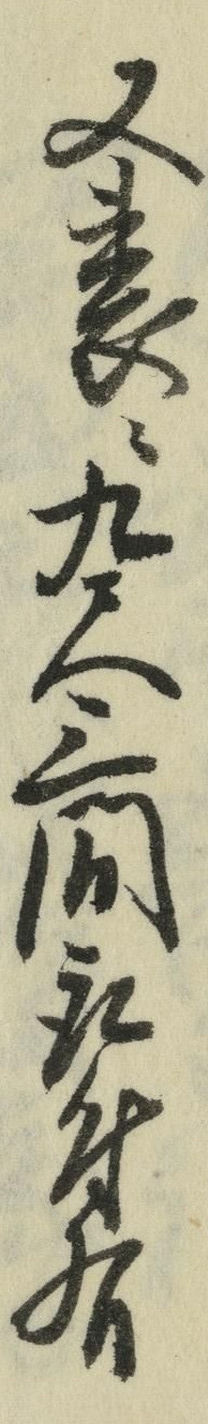又裏二九尺三間取付有
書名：天明淺間噴火ニ関スル書類
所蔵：東京大学地震研究所図書室 Earthquake Research Institute Library, The University of Tokyo, JAPAN
